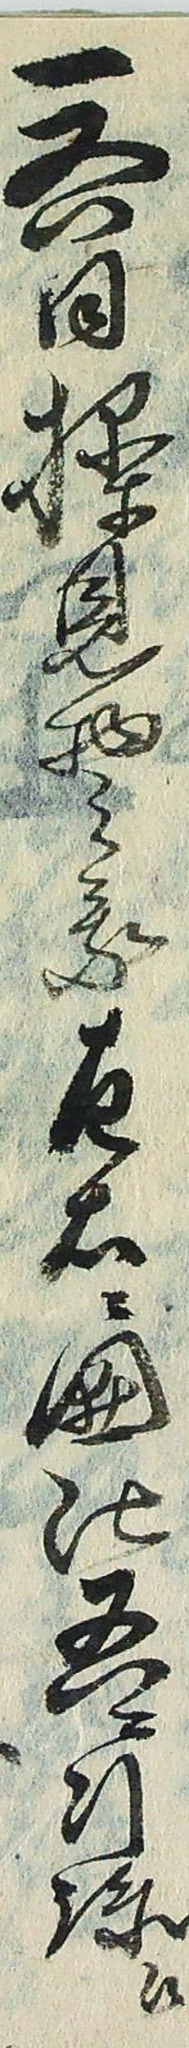一右日操見物之義左右に囲仕右に引添え
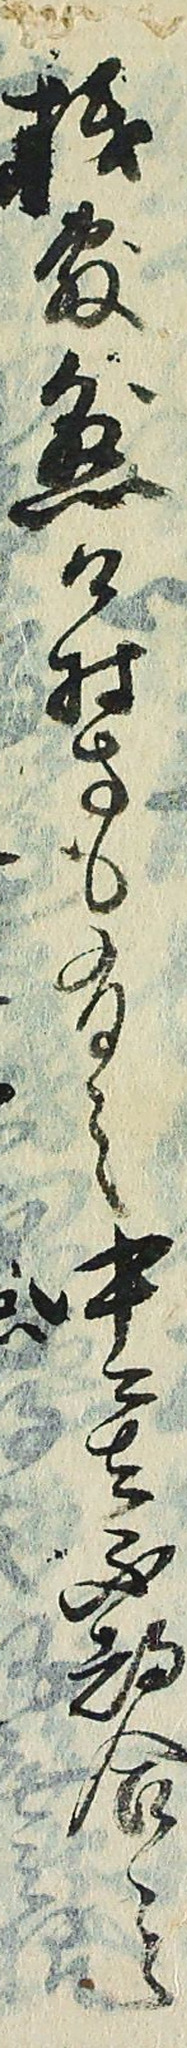桟敷懸候村方も有之中には不都合之
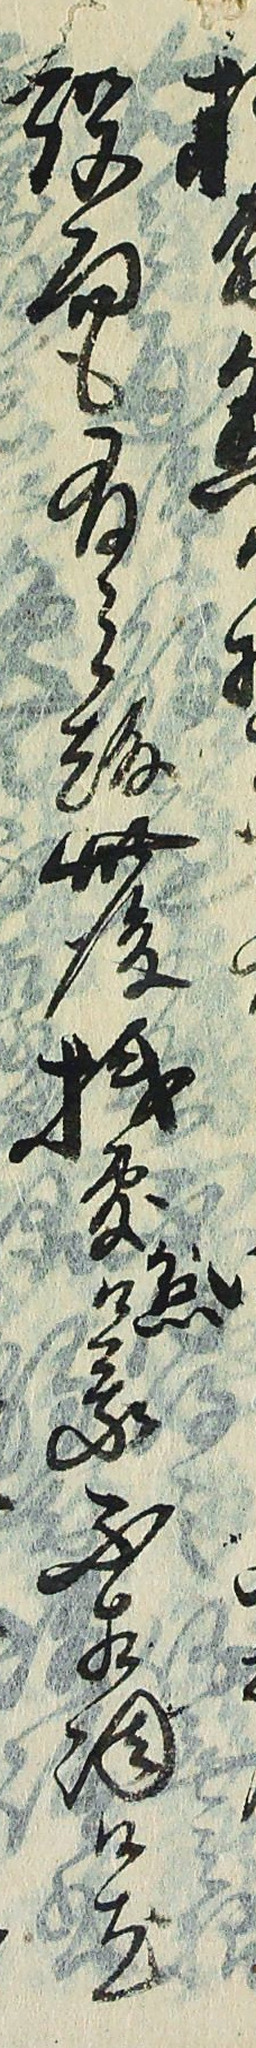役向も有之趣此度後桟敷懸候義不相調候尤
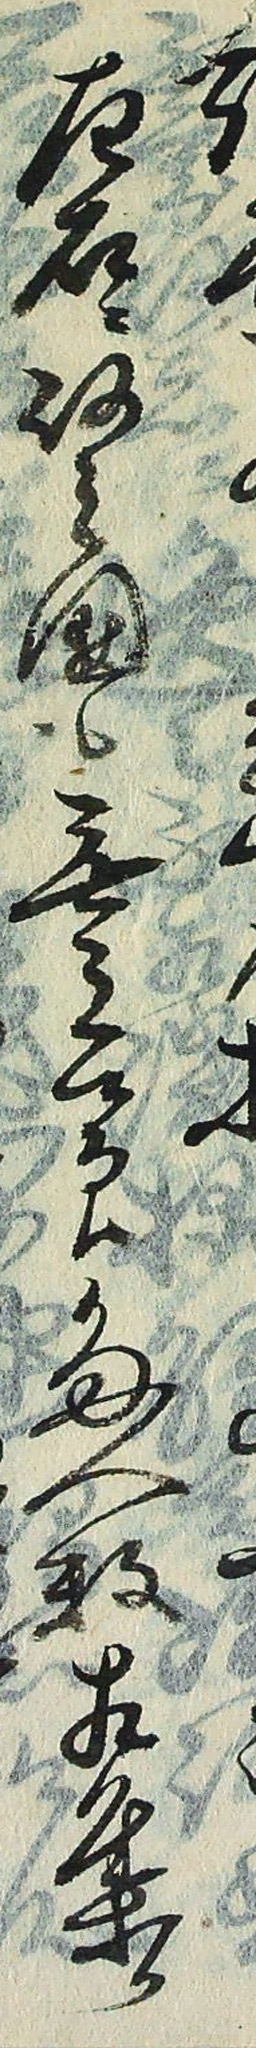左右に何之囲も無之候而は多人数相集り
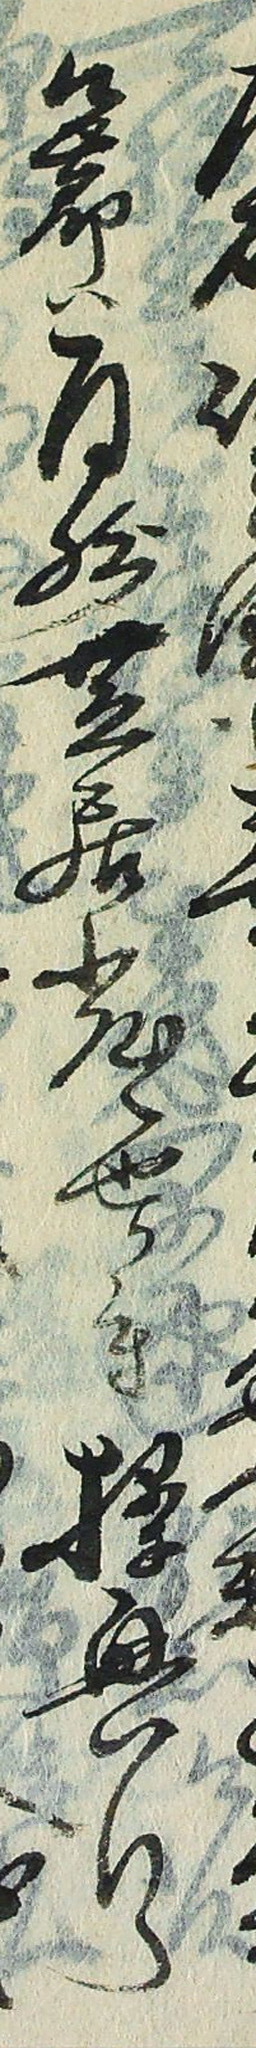候節は自然芝居小屋へ也候に付操興行
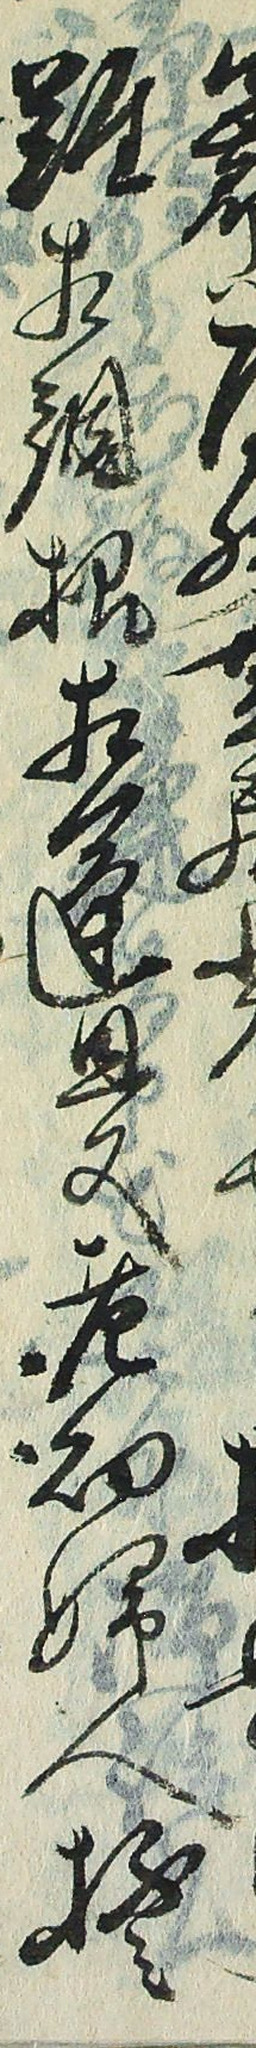難相調様相運且又老若婦人抔之
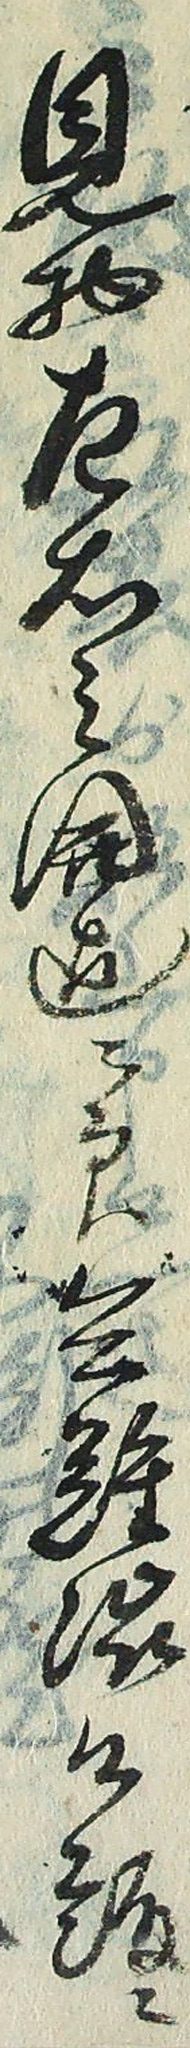見物左右之囲迄に而は令難渋候趣に
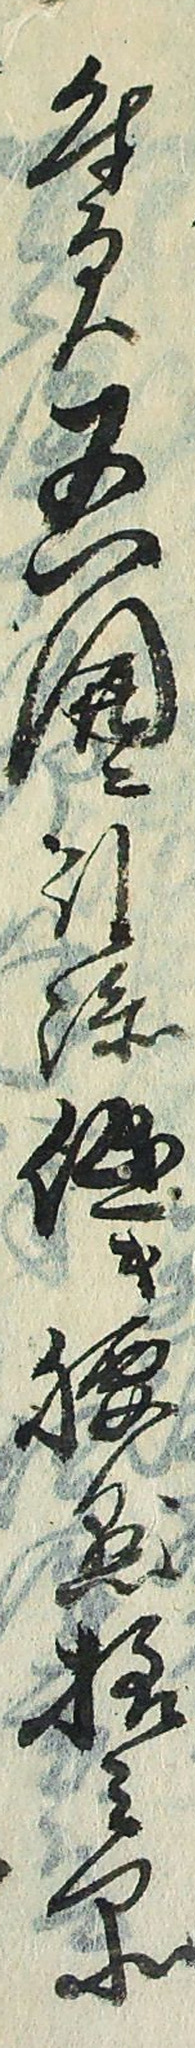付而は右囲に引添候低き腰懸様之品
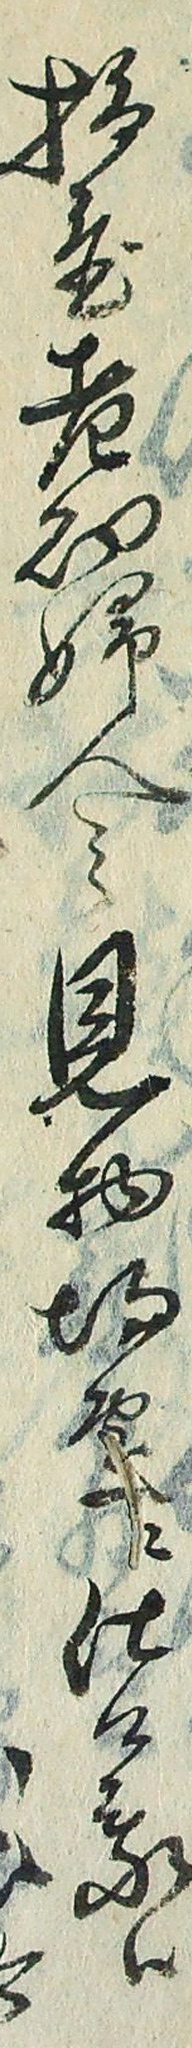指置老若婦人之見物場処に仕候義は
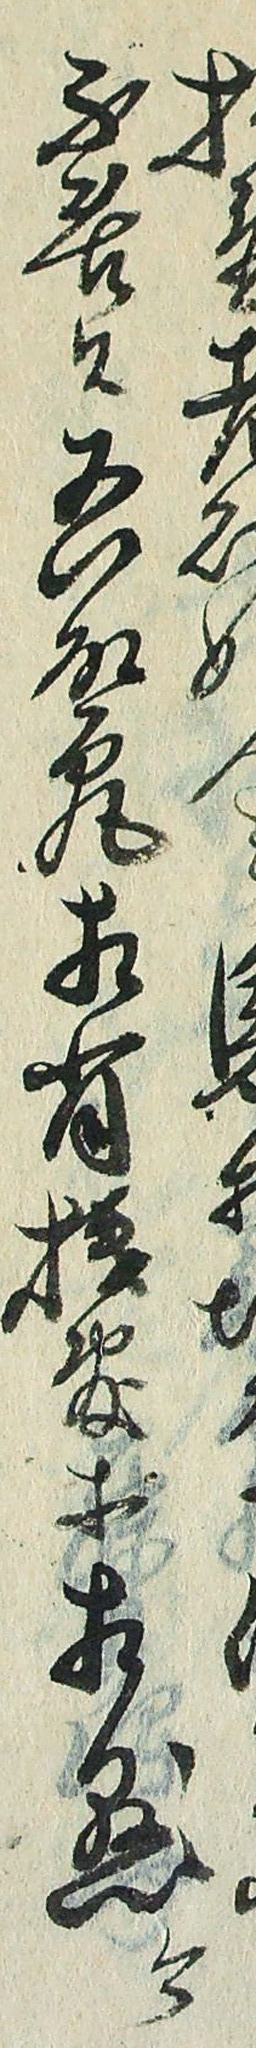不苦候右取究相背桟敷等於相懸け

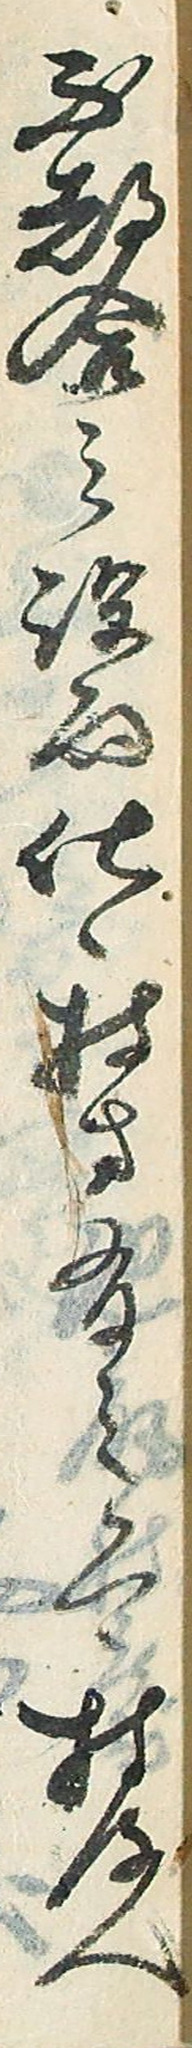不都合之役向仕候村方有之候はゝ村役人
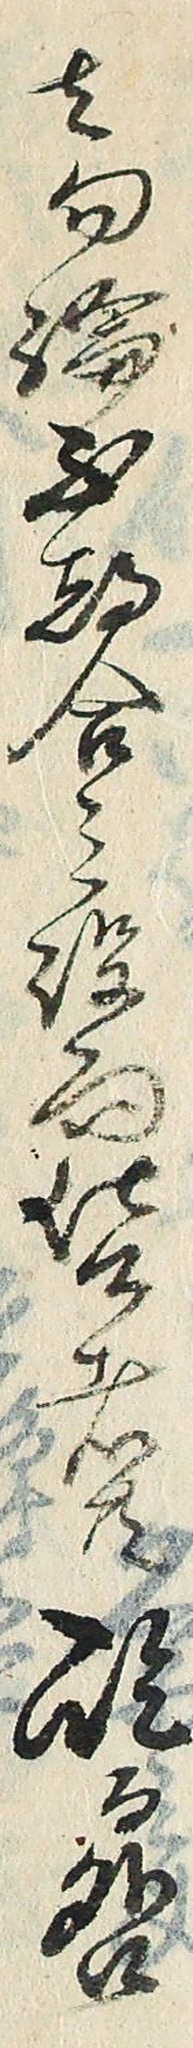は勿論不都合之役向仕候者共屹と咎
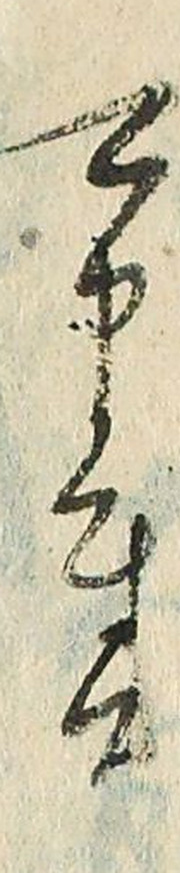可申付候
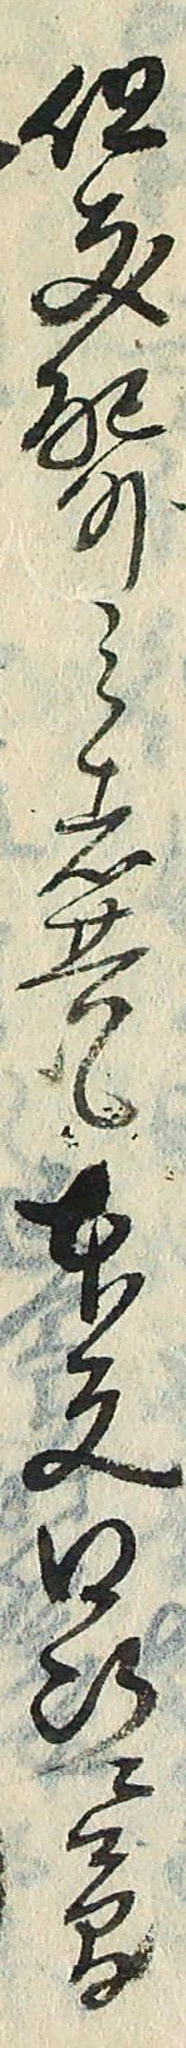但支配外之者共も本文同断に候間
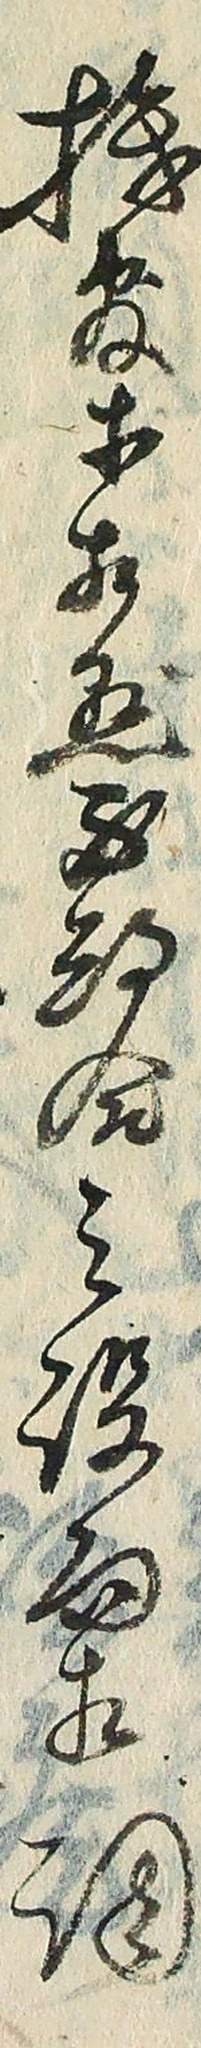桟敷於相懸不都合之役向相調
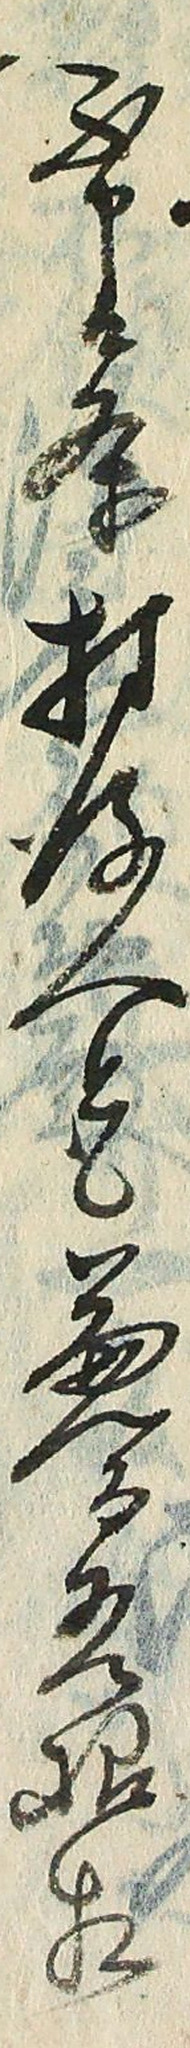不申候条村役人とも兼而右様相
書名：諸御用御□受書控
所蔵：鳴門教育大学 Naruto University of Education
